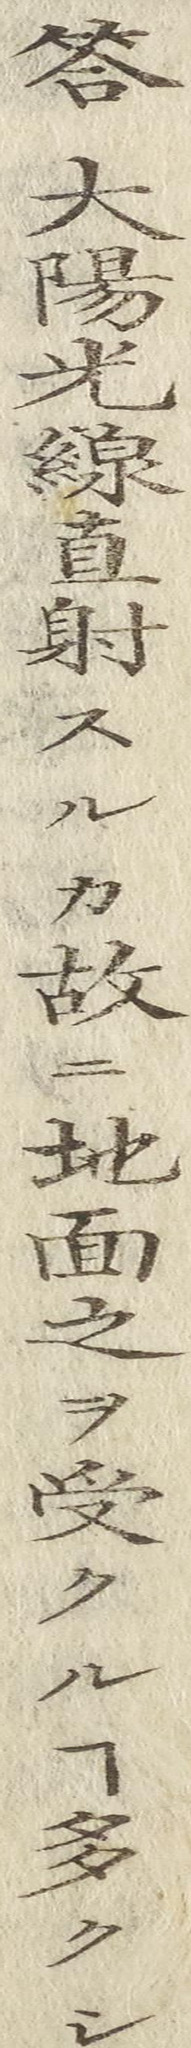答大陽光線直射スルカ故ニ地面之ヲ受クルコト多クシ
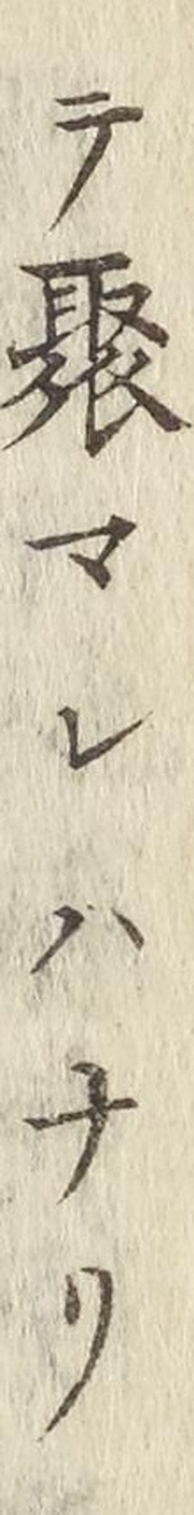テ聚マレハナリ
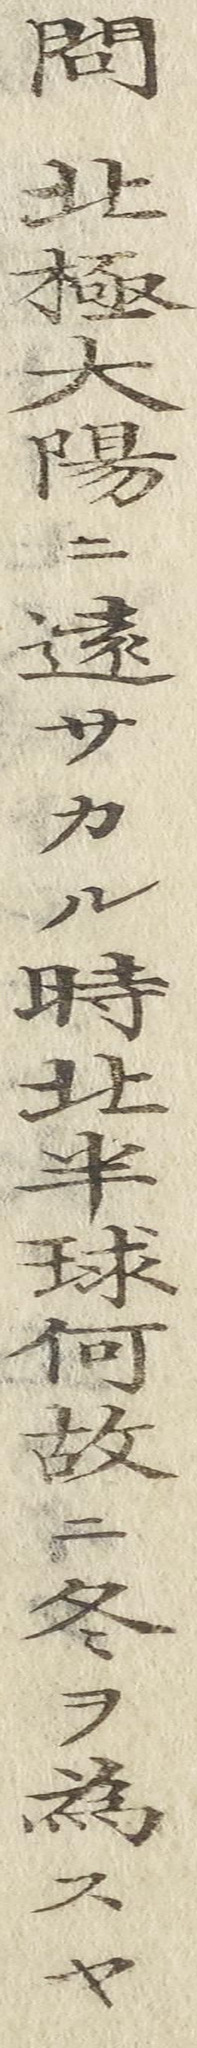問北極大陽ニ遠サカル時北半球何故ニ冬ヲ為スヤ
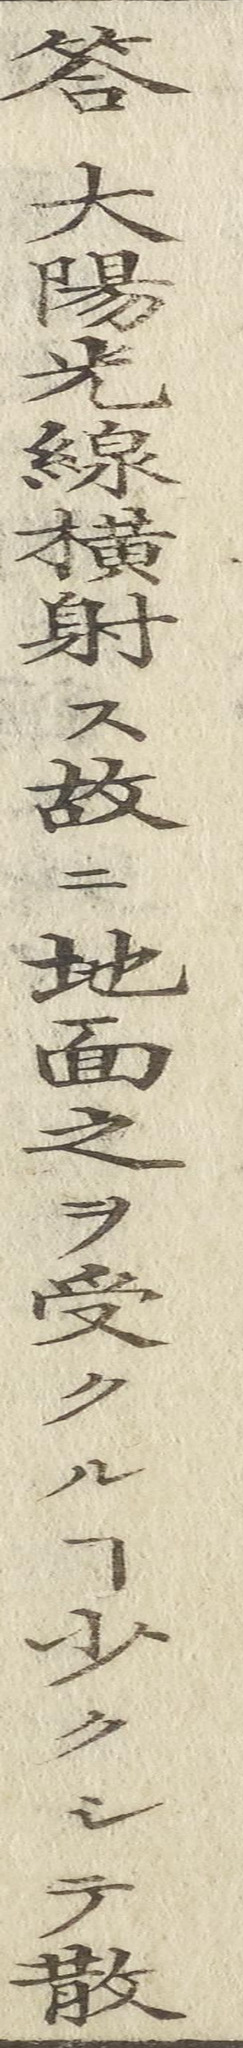答大陽光線横射ス故ニ地面之ヲ受クルコト少クシテ散
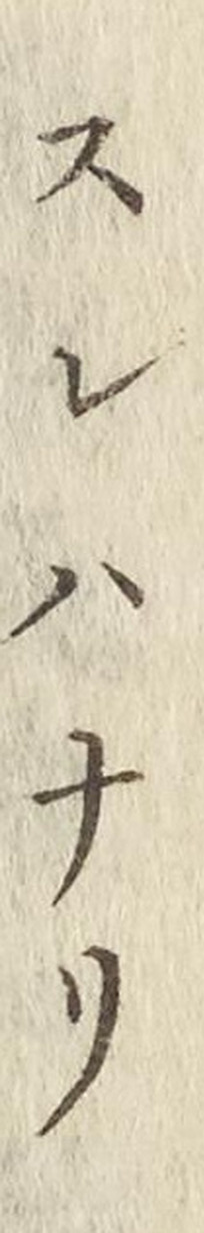スレハナリ
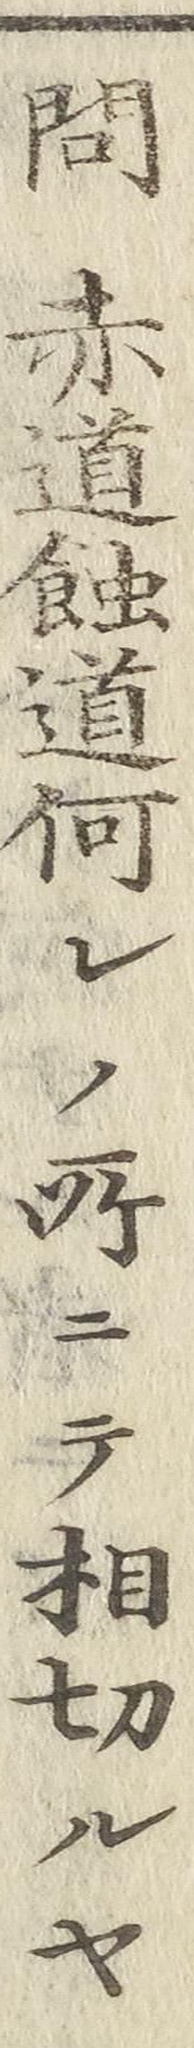問赤道蝕道何レノ所ニテ相切ルヤ
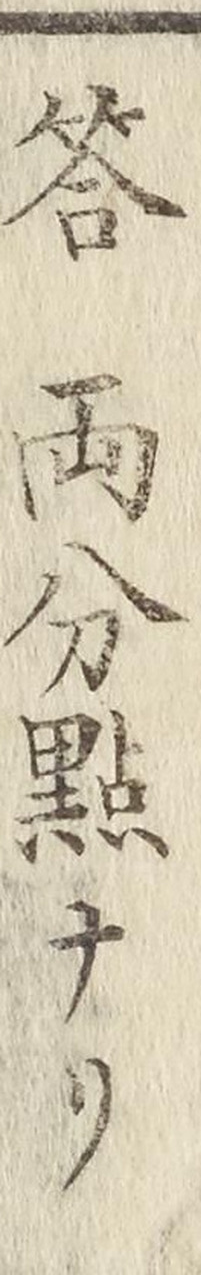答両分点ナリ
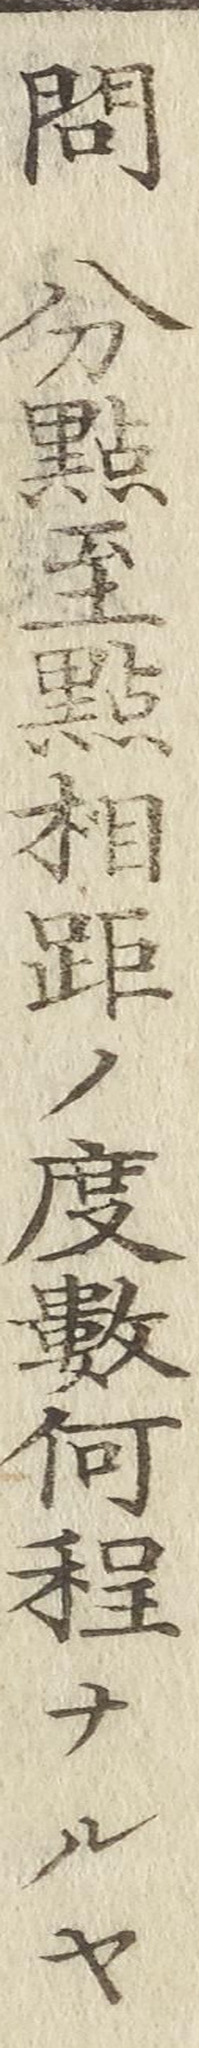問分点至点相距ノ度数何程ナルヤ

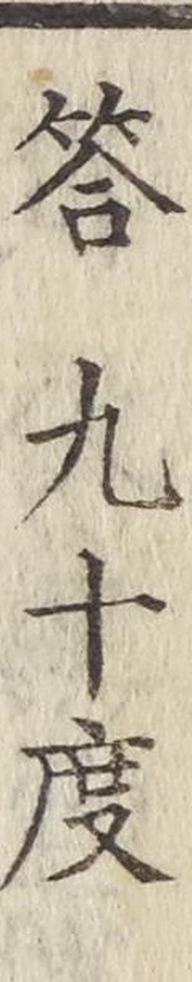答九十度
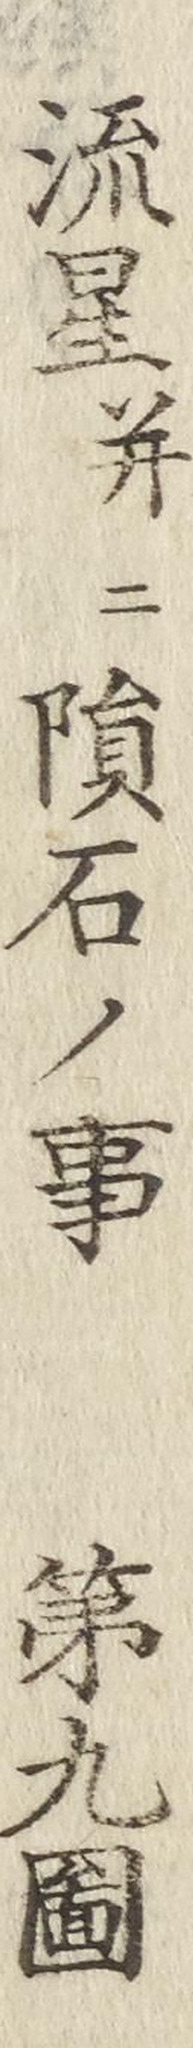流星幷ニ隕石ノ事第九図
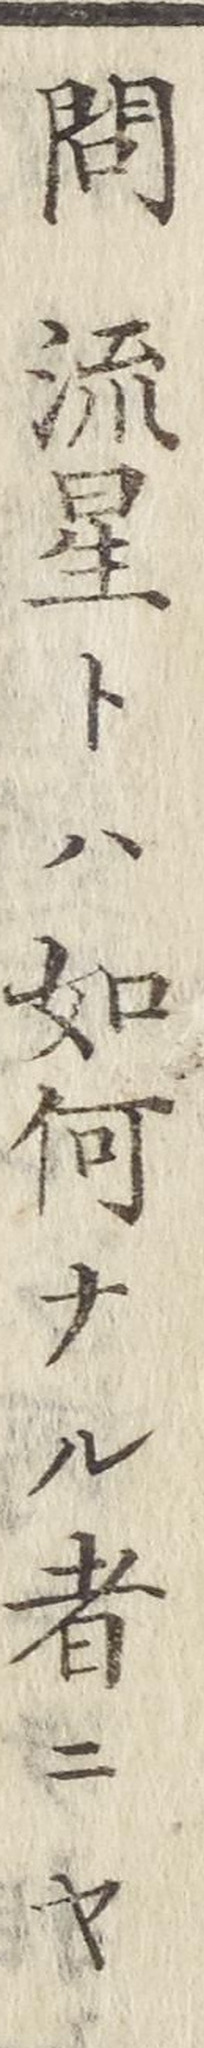問流星トハ如何ナル者ニヤ
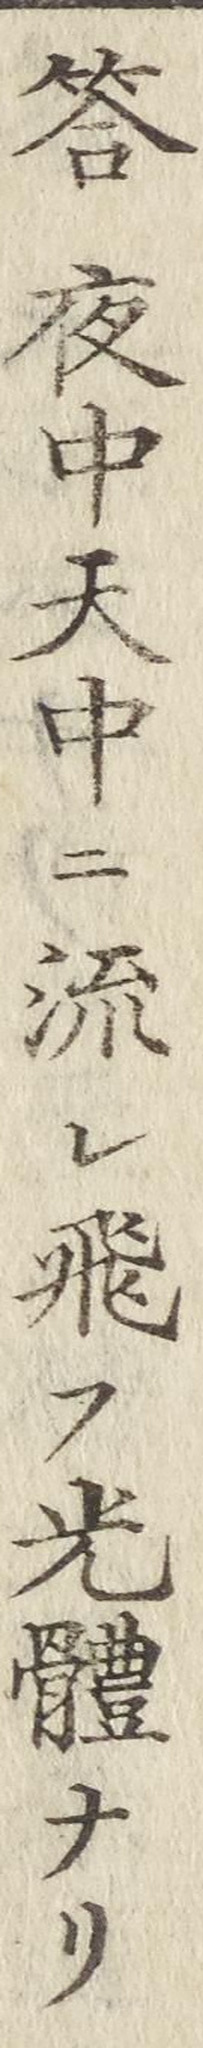答夜中天中ニ流レ飛フ光体ナリ
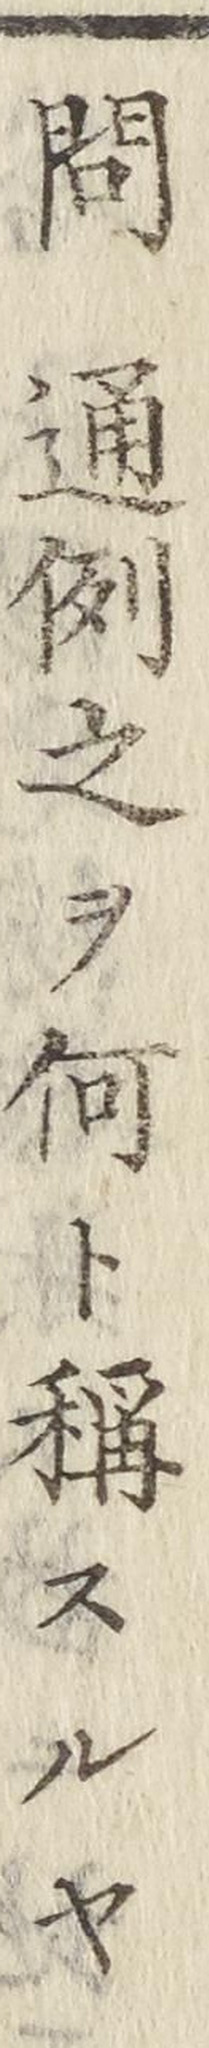問通例之ヲ何ト称スルヤ
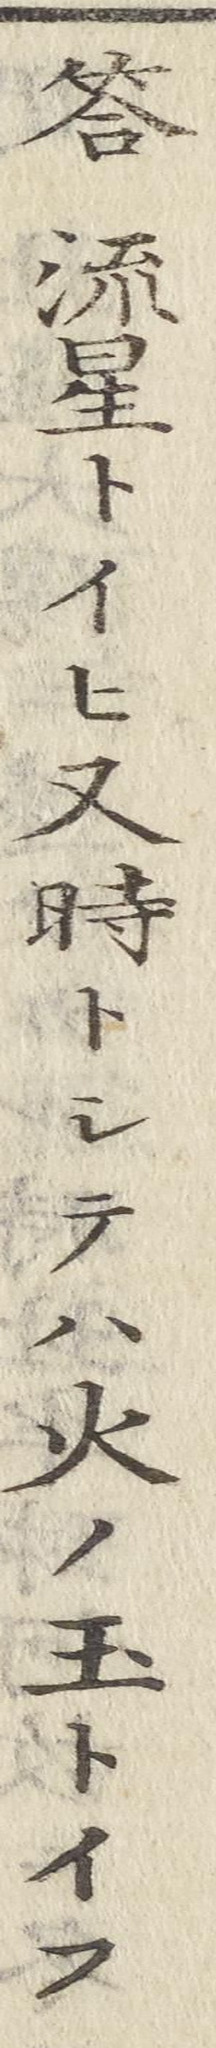答流星トイヒ又時トシテハ火ノ玉トイフ
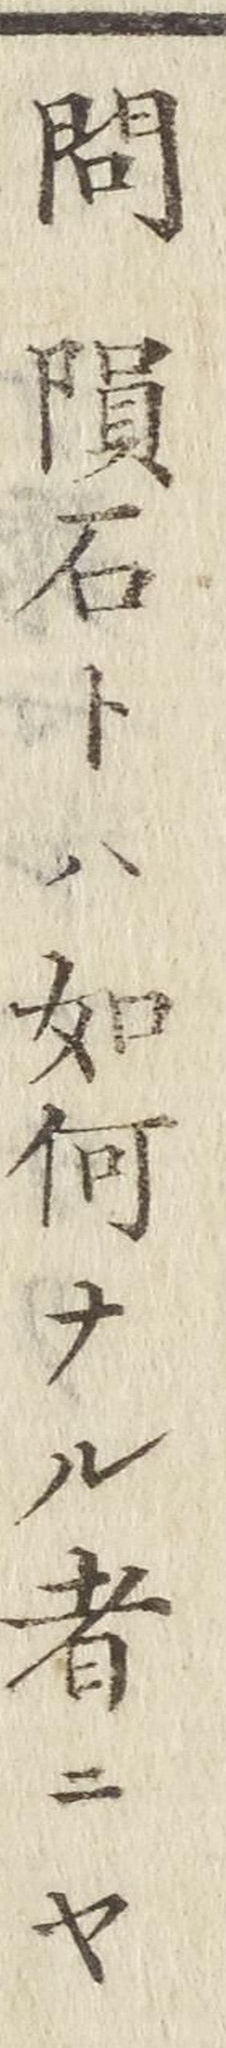問隕石トハ如何ナル者ニヤ
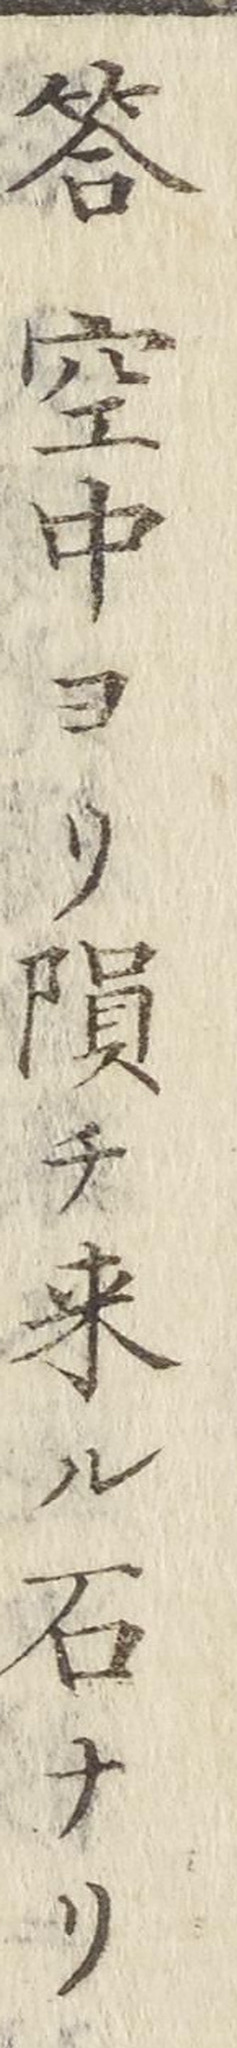答空中ヨリ隕チ来ル石ナリ
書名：星学圖説　上
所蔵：東京大学地震研究所図書室 Earthquake Research Institute Library, The University of Tokyo, JAPAN
